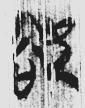欲
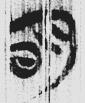明
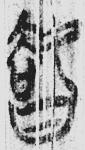智（知）
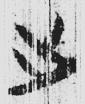之
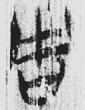周
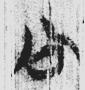公
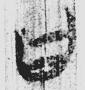曰
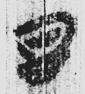旦
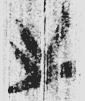之
